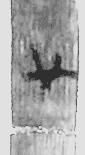廿
